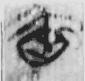○（屈）
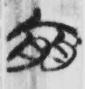宜
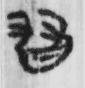習
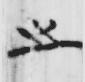之
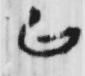㠯（以）
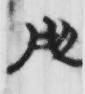彤
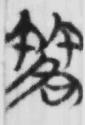笿
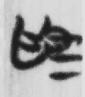爲
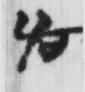左
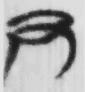尹
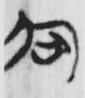卲
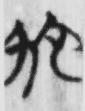{力它}
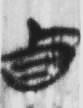貞
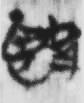既
